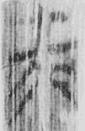夫
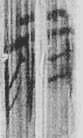雨
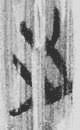之
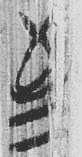至
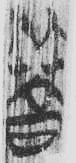{竹亯}（熟）
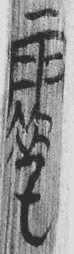{雨垂}（唾）
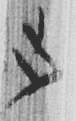之
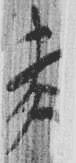夫
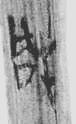○（風）
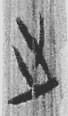之
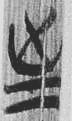至
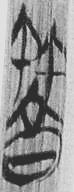○（孰）
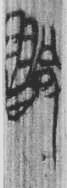飁
